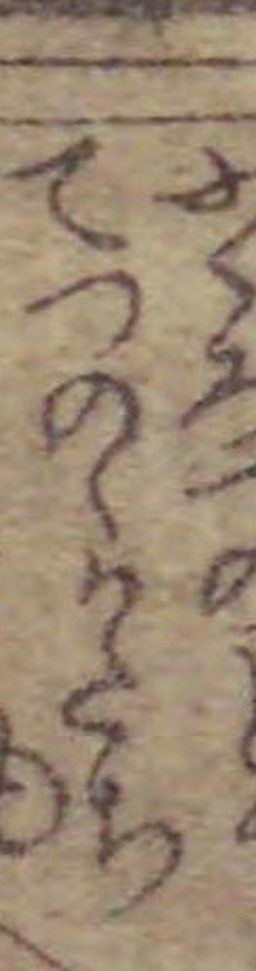てつのゝかたち
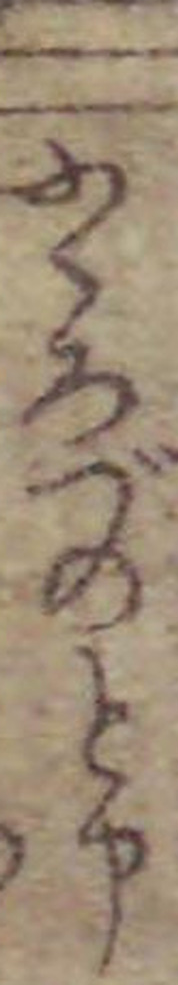ふくろづのと申
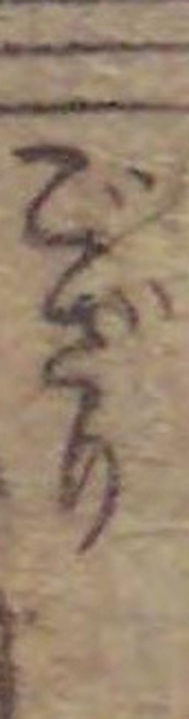ござり
